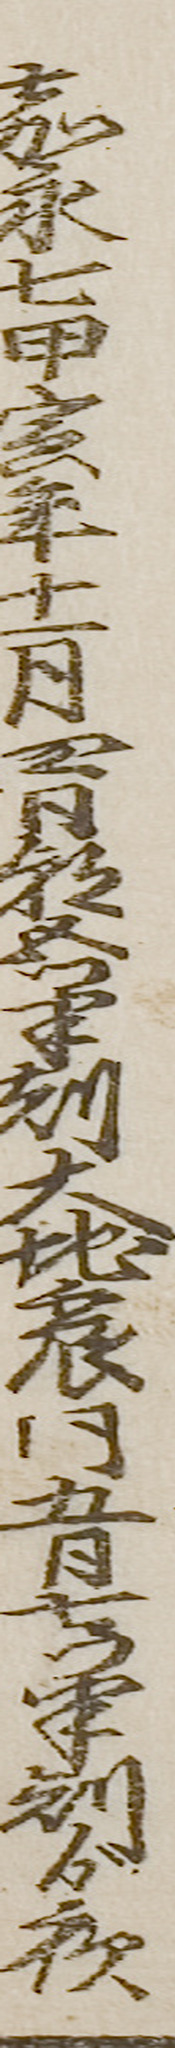嘉永七甲寅年十一月四日朝五ツ半刻大地震同五日七ツ半刻ゟ夜
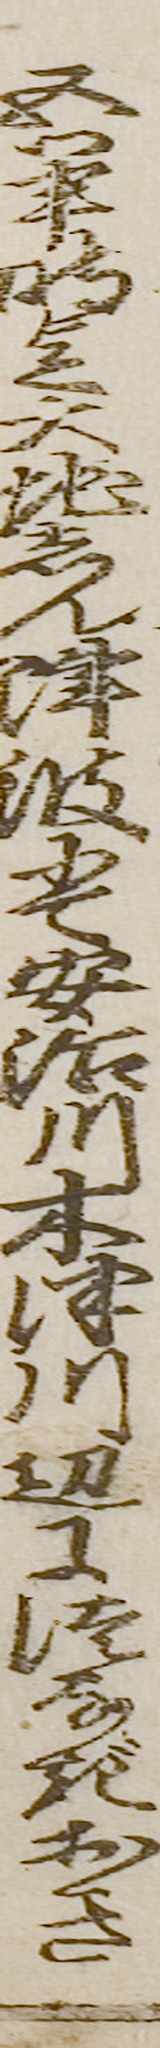五ツ半時迄大地しん津波にて安治川木津川辺につなぎおき
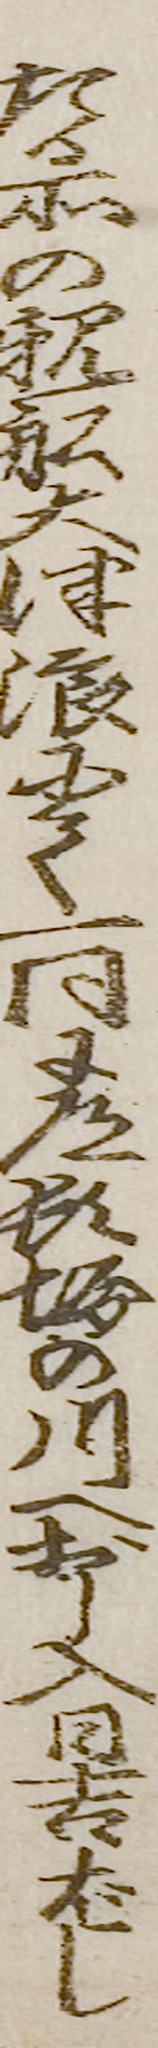たる所の親舩大津浪にて一同に道頓堀の川へおし入日吉ばし
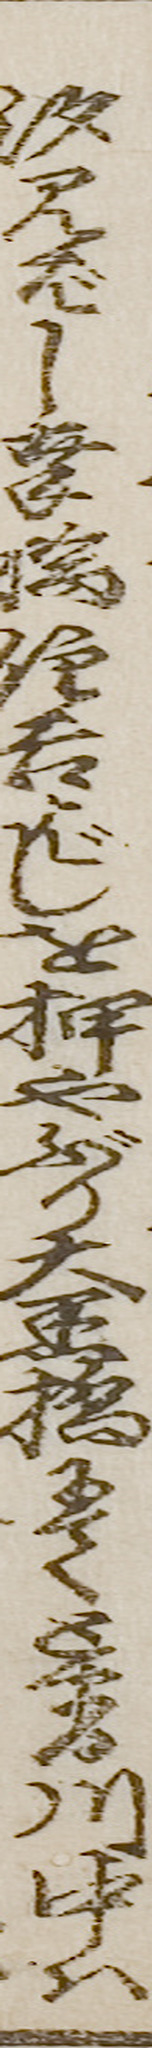汐見ばし幸橋住吉ばしを押やぶり大黒橋にてとまる川中は
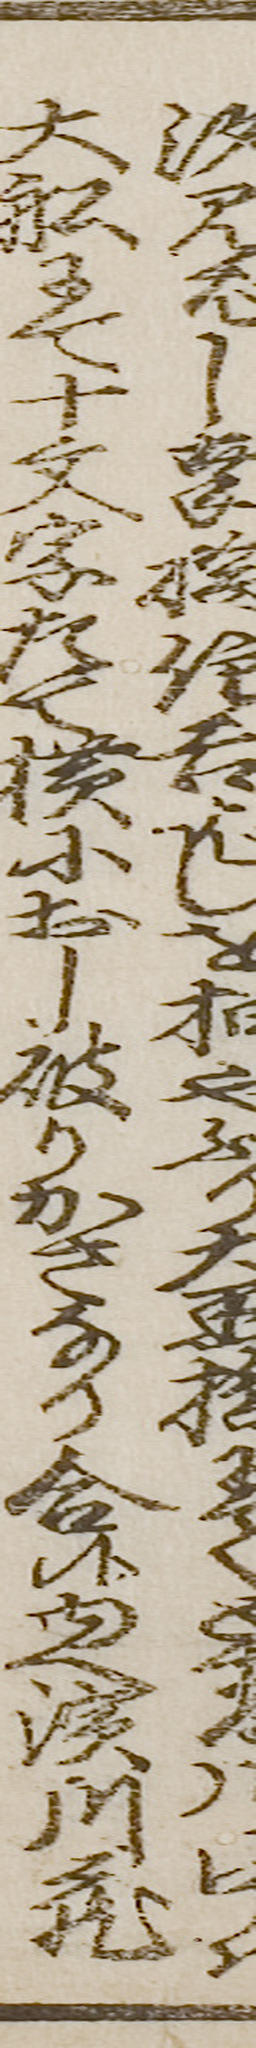大舩にて十文字たて横におし破りかさなり合候ゆへ濱川蔵
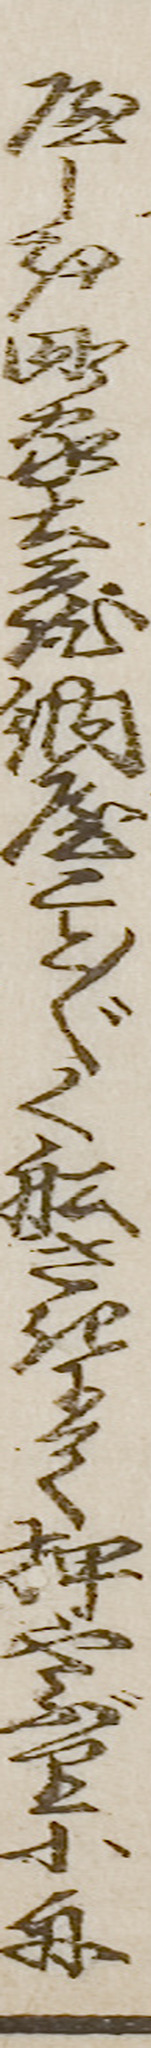屋しき町家土蔵納屋こと〴〵く舩さきにて押やぶり小舟
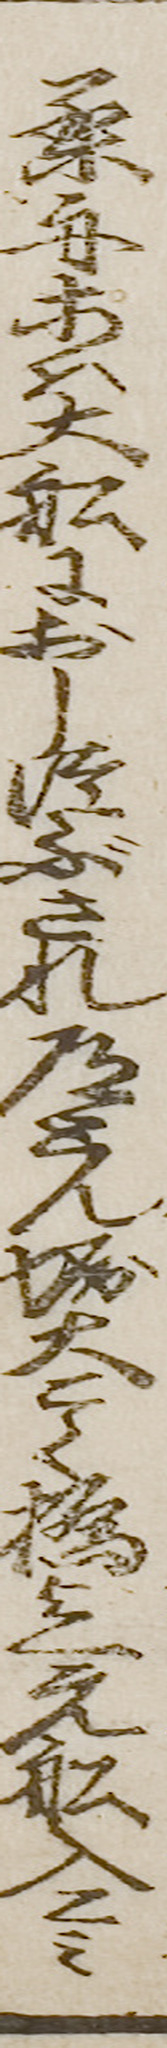茶舟等は大舩におしつぶされ道とん堀大こく橋迄元舩入こみ
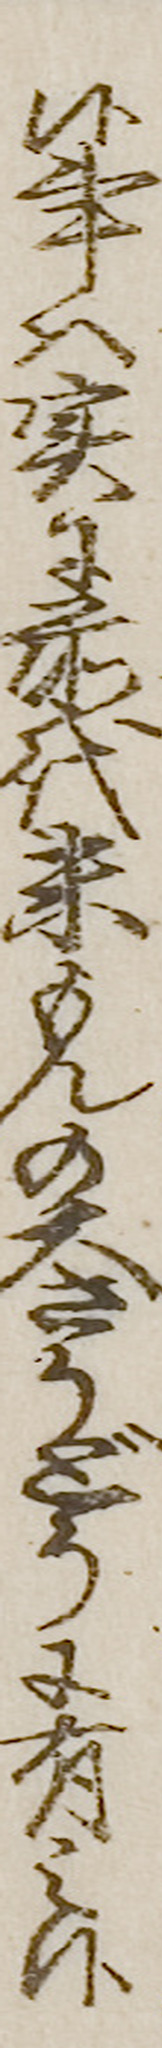候事は実に前代未もんの大さうどうに有之候
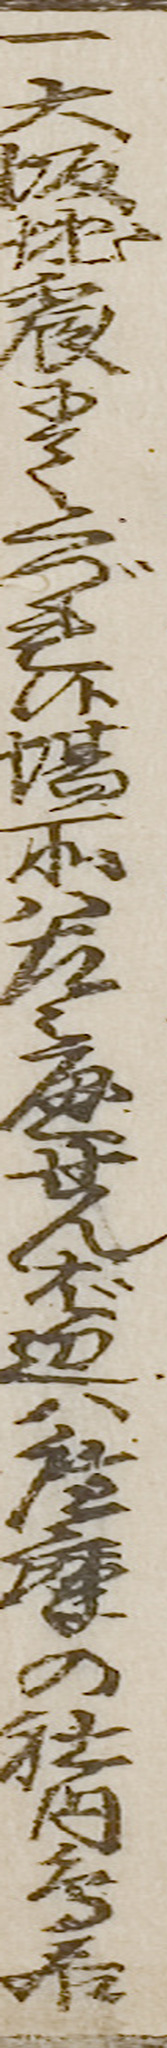一大坂地震にてくづれ候場所は左之通せんば辺は座摩の社内鳥居
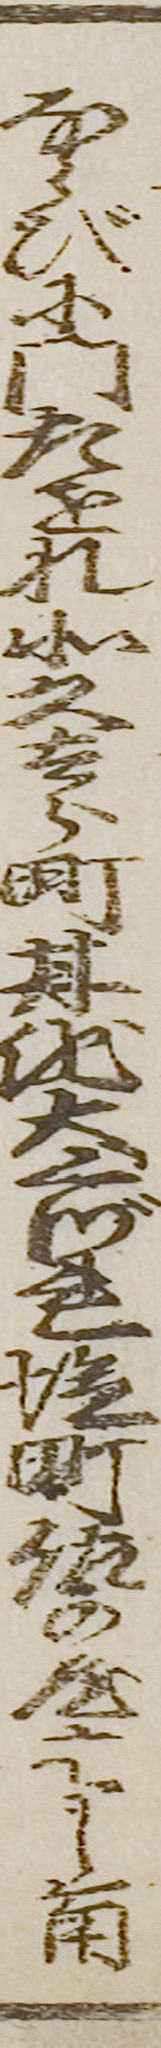ならびに門たをれ北久太郎町丼池大くづれ塩町佐の屋ばし角
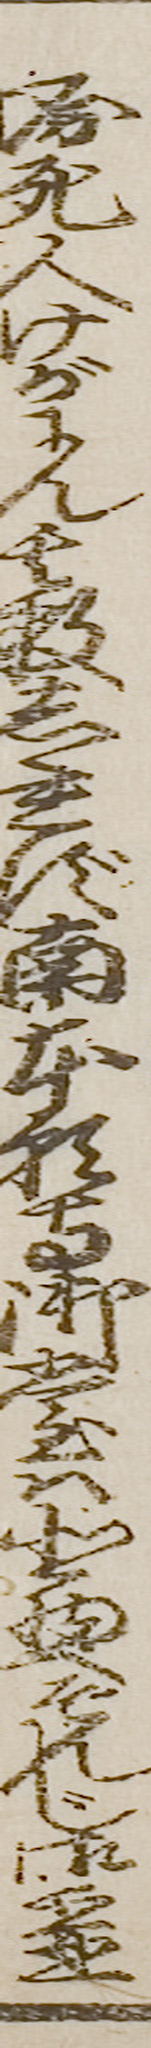堀死人けがにん其数しれず南本願寺御堂は北西へぞんじ御霊
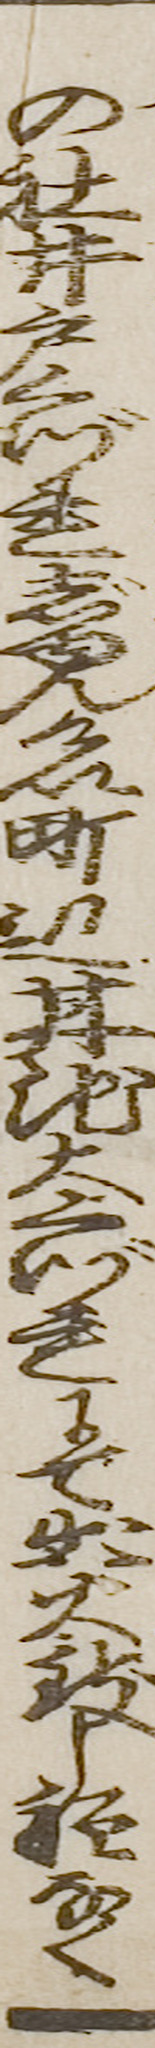の社井戸くづれじゆんけい町辺丼池大くづれにて出火致し程なく
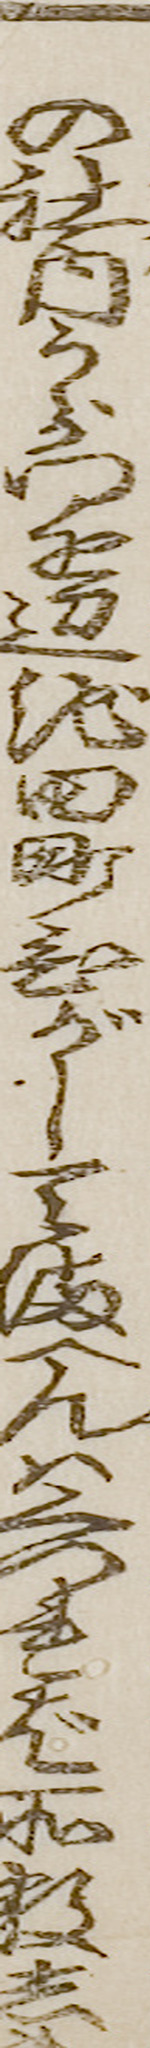の社内うら門近辺池田町ひがし天満へんはくつれば所数しれ
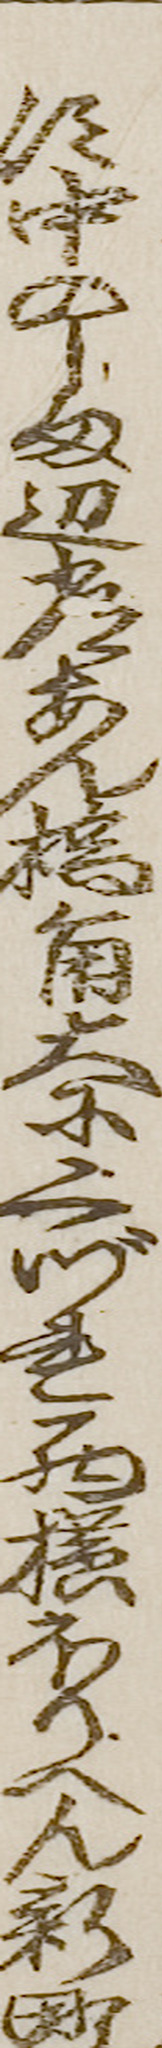す中のしま辺常あん橋角大にくづれ西横ほりへん新町遊女
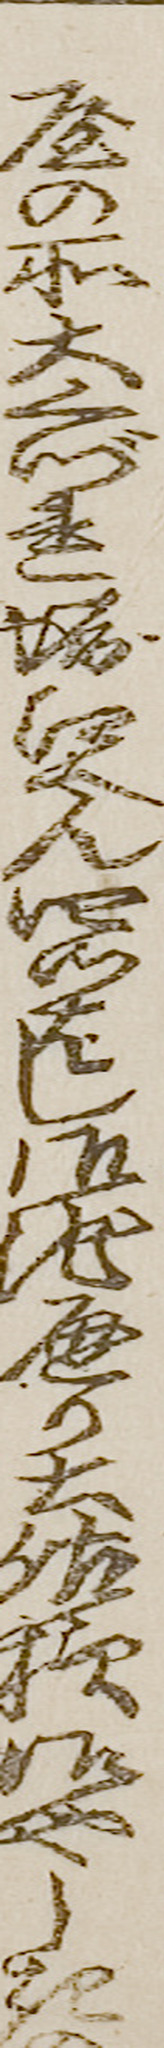屋の所大くづれ堀江へん四ツはし御池通り土佐様おやしきの堀
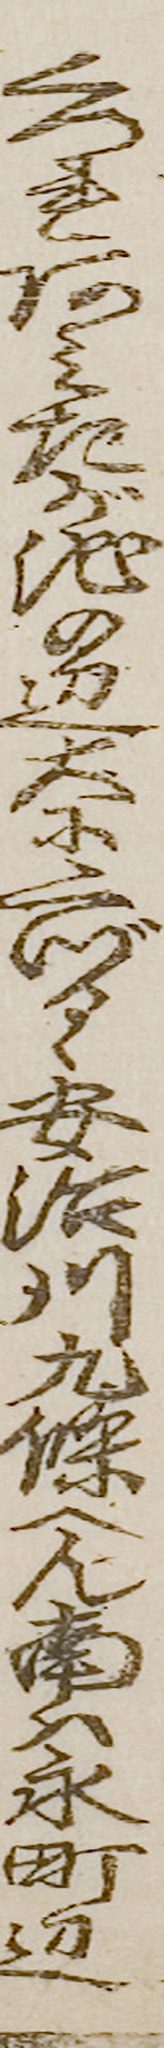くつれあみたが池の辺大にくづるゝ安治川九條へん南は永町辺
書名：大坂大地震津浪記
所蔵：東京大学総合図書館 General Library in the University of Tokyo, JAPAN
